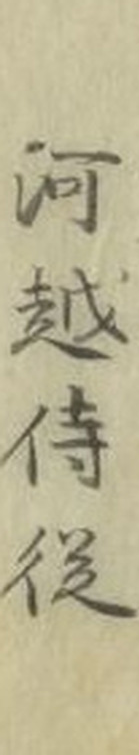河越侍従
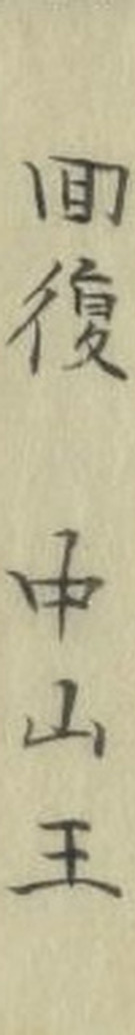回復中山王
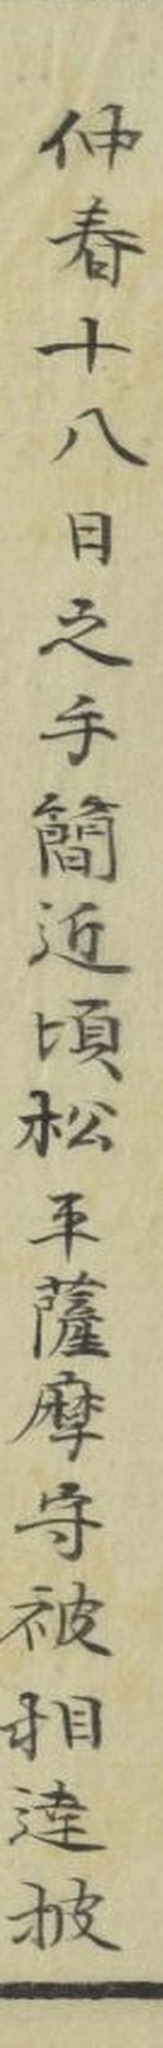仲春十八日之手簡近頃松平薩摩守被相達披
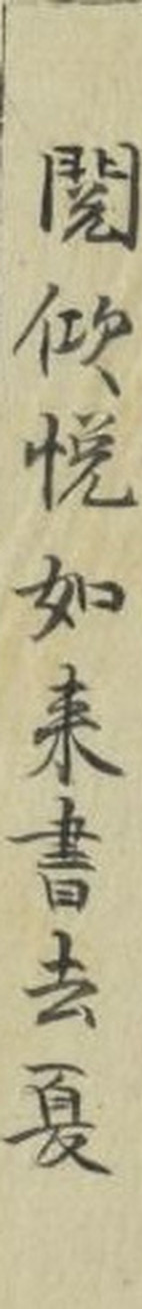閲欣悦如来書去夏
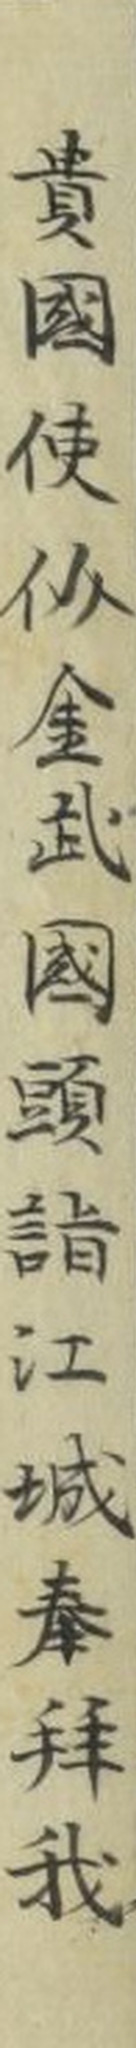貴国使价金武国頭詣江城奉拝我
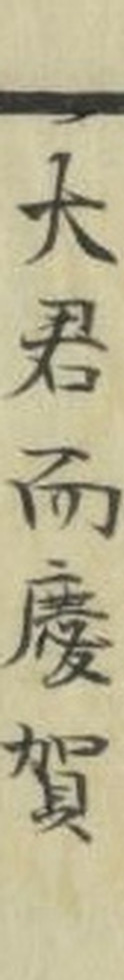大君而慶賀
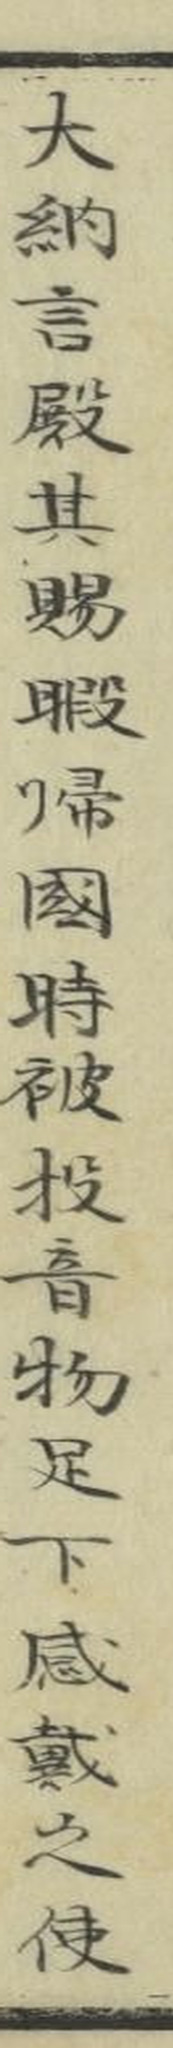大納言殿其賜暇帰国時被投音物足下感載之使
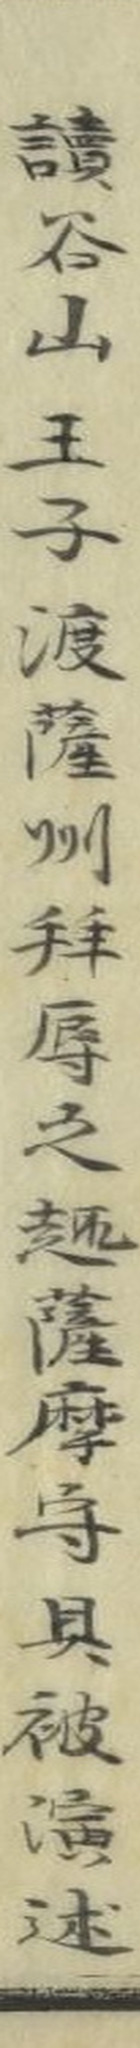読谷山王子渡薩州拝辱之趣薩摩守具被演述
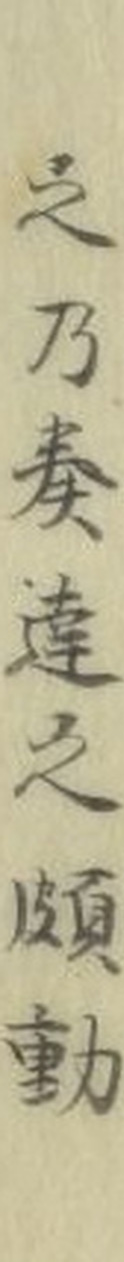之乃奏達之頗動
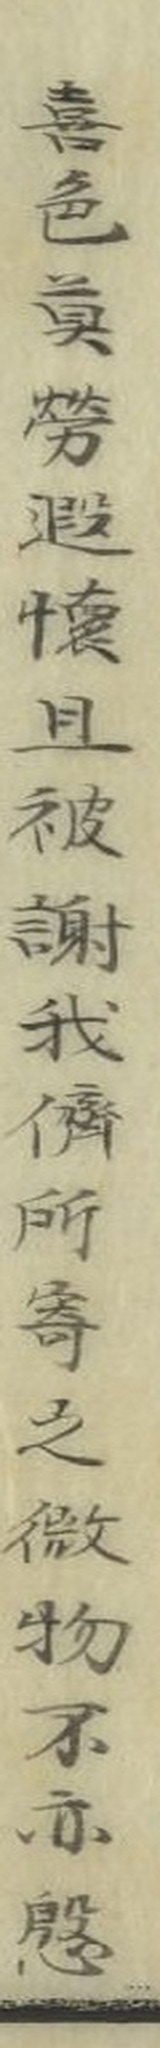喜色莫労遐懐且被謝我済所寄之徴物不亦慇
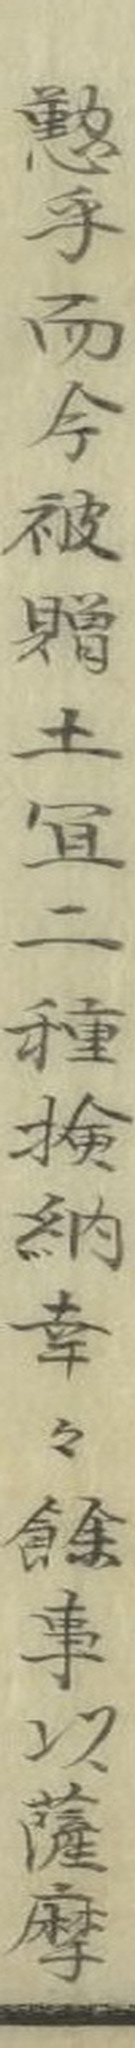懃乎而今被贈土冝二種撿納幸々余事以薩摩
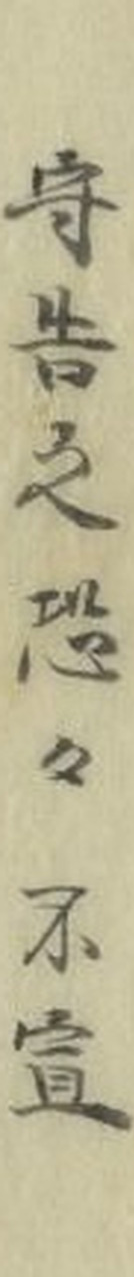守告之恐々不宣
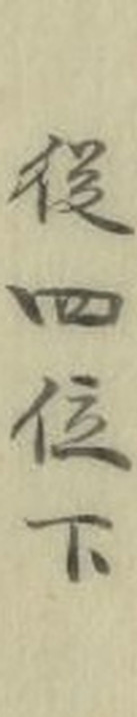従四位下

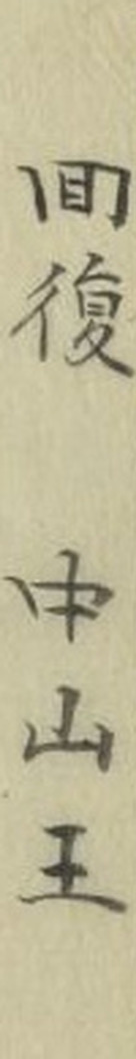回復中山王
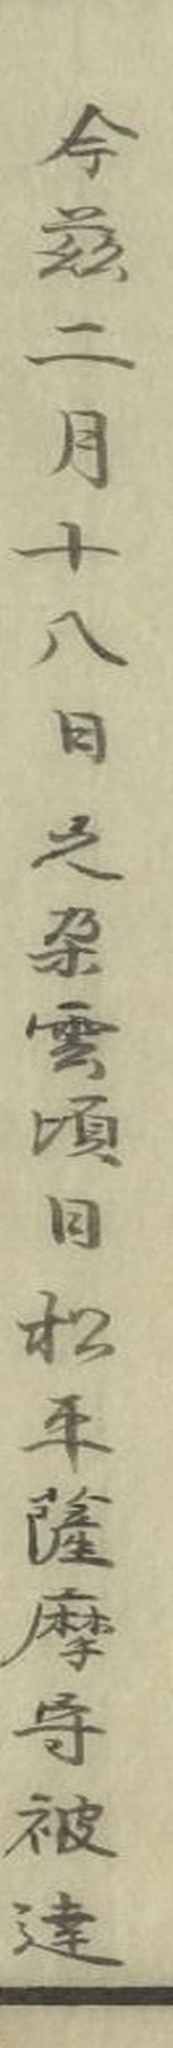今茲二月十八日之朶雲頃日松平薩摩守被達
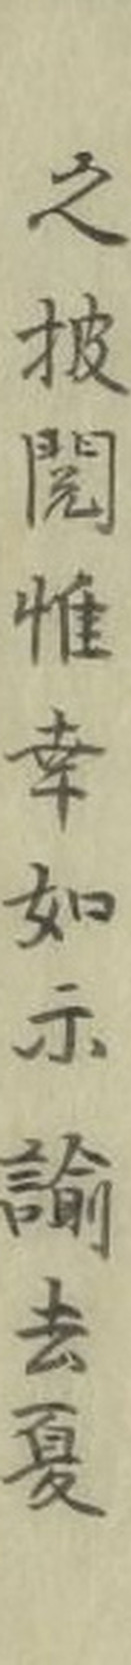之被閲惟幸如示論去夏
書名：琉球往来（上）
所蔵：University of the Ryukyus Library
